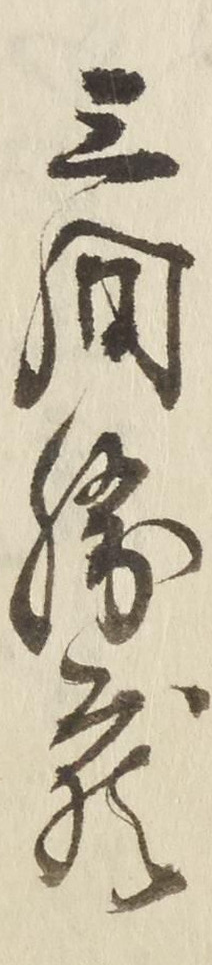三間勝蔵
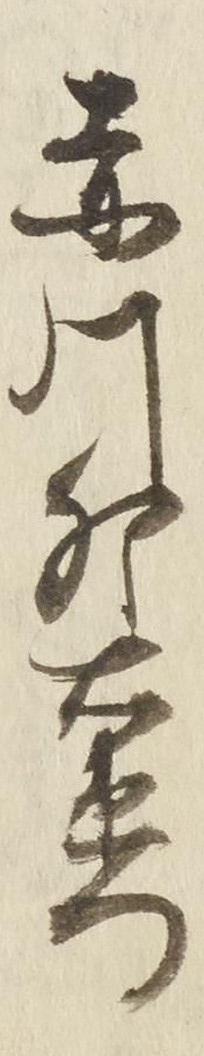赤川卯右衛門
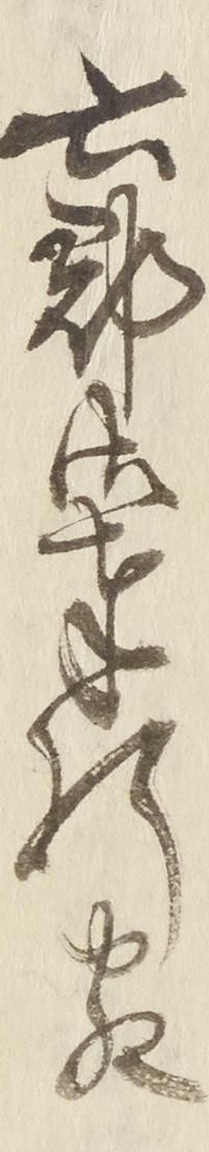六郡御奉行宛
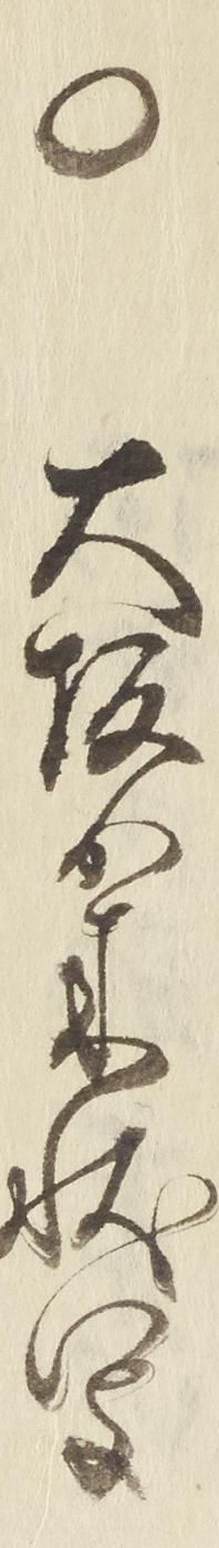◯大坂ゟ来状写
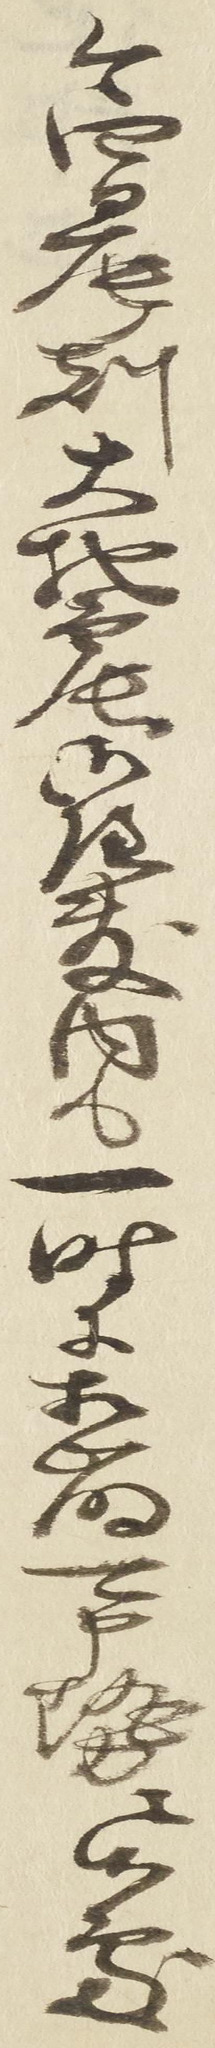今四日辰ノ刻大地震御屋敷内も一時に相崩可申勢二侯処
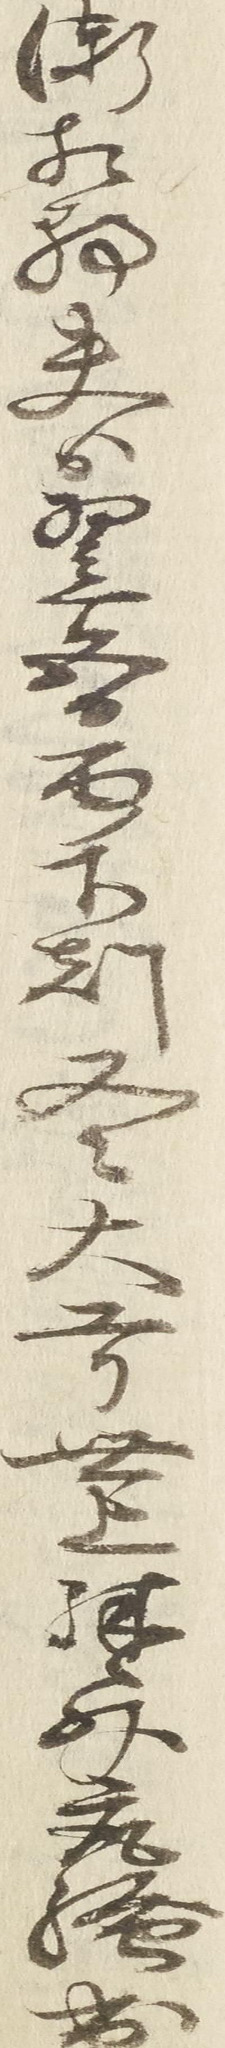漸相静夫ゟ翌五日酉ノ下刻又々大ユリ世上殊之外取騒出
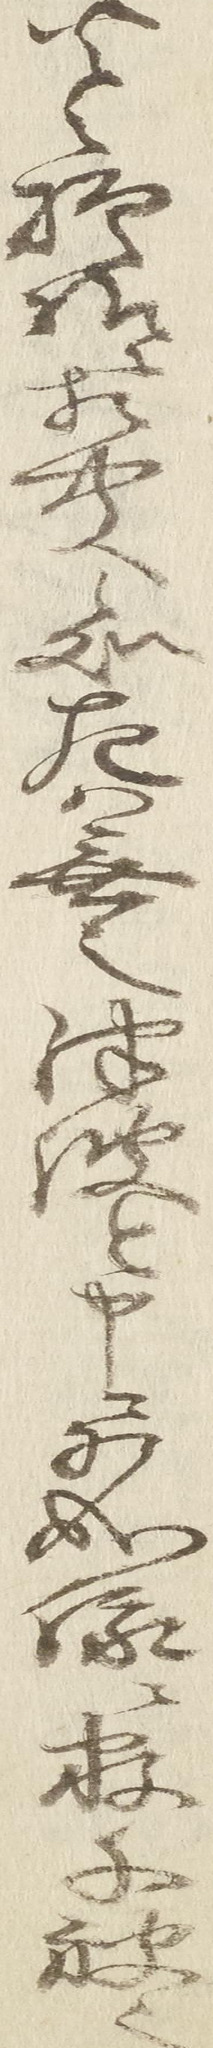火之模様二相聞へ候処左は無之津波と申二相成俄二数千艘之
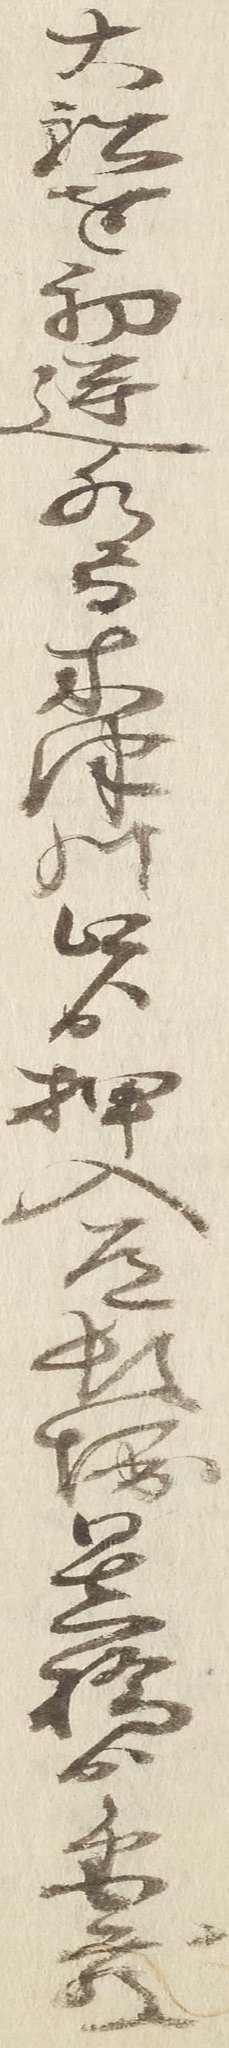大船を初逆水二而木津川口ゟ押入道頓堀日吉橋ゟ金屋
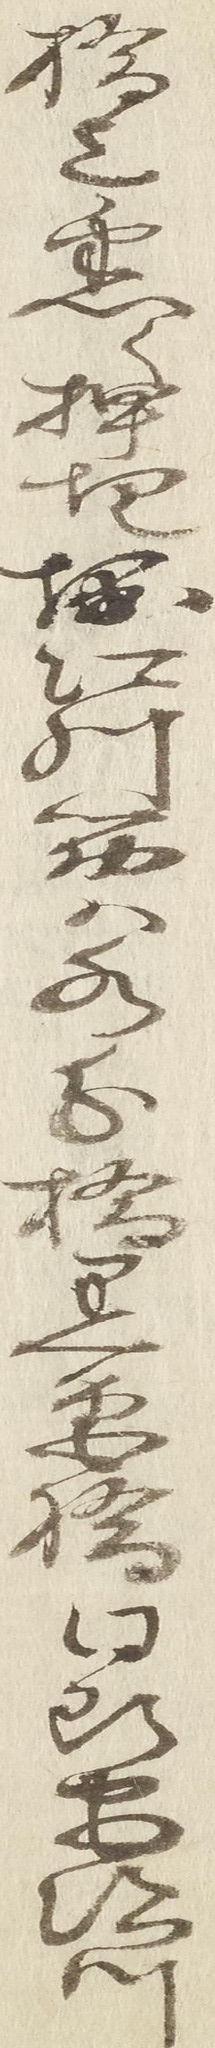橋迄悉く押し切れ堀江川筋は水分橋黒金橋同断安治川
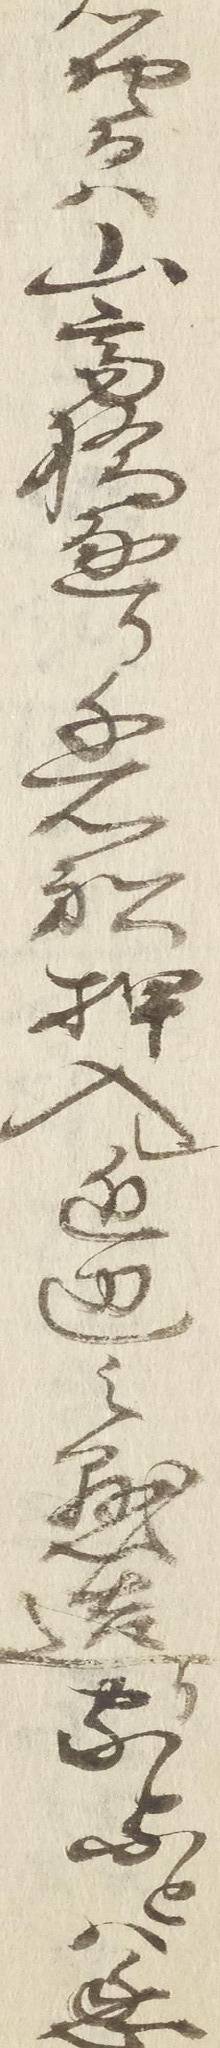筋は山高橋通千石船押入ㇾ近辺之懸造り家なとは悉
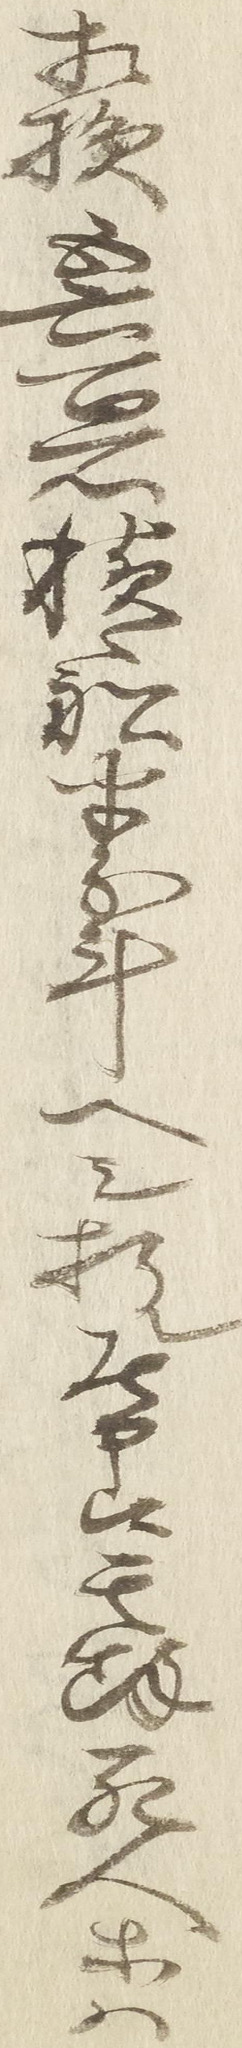相損五六百石積船半分斗へシ折レ居申候其餘死人等は
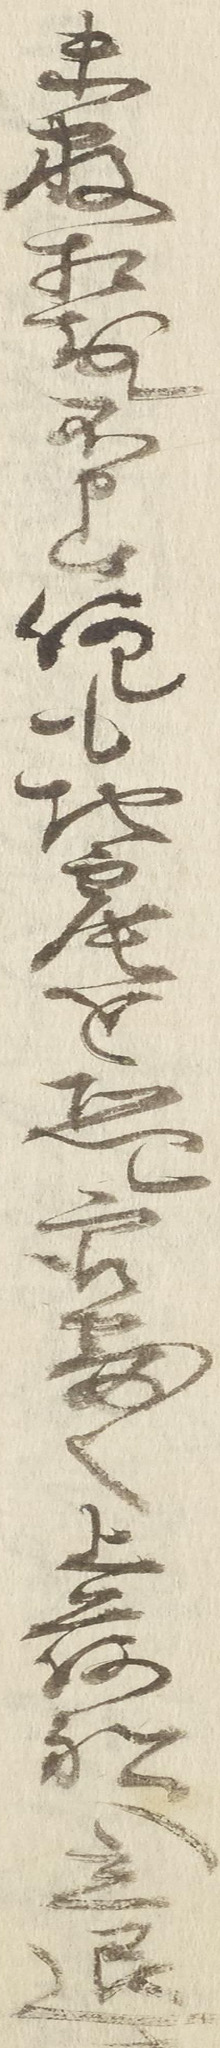未数相知ㇾ不申候何ㇾも地震を恐ㇾ最寄の上荷船へ立退キ
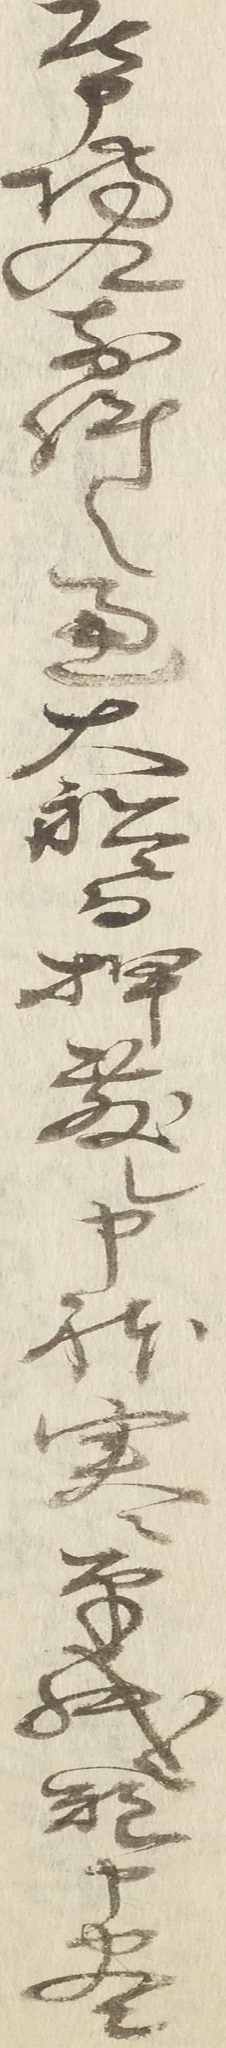居申場合前件之通大船二而押散ㇾ申体実に筆紙に難申尽
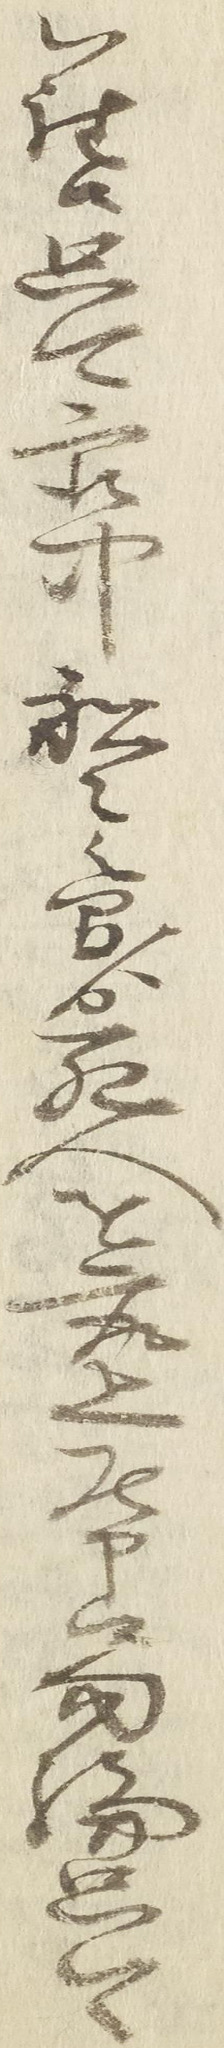御座候只今最中船々之間ゟ死人を取上居申候勿論只今
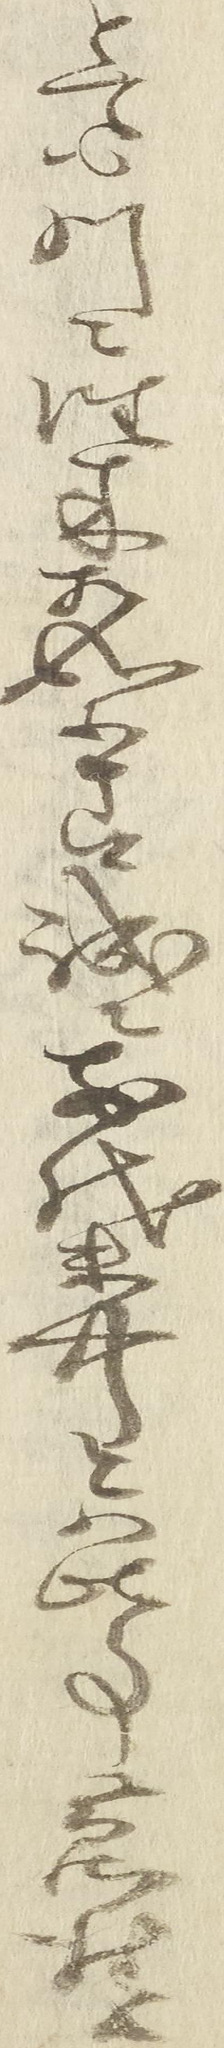とても川に往来相成不申候誠に前代未聞とは此事に御座候

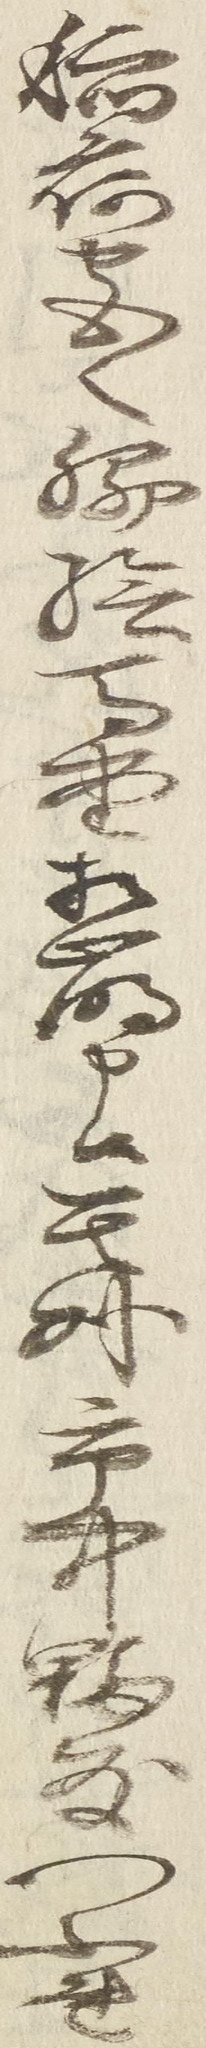稲荷宮脇絵馬堂相崩申候其外市中夥敷つふれ
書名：地震記　下
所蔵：東京大学地震研究所図書室 Earthquake Research Institute Library, The University of Tokyo, JAPAN
